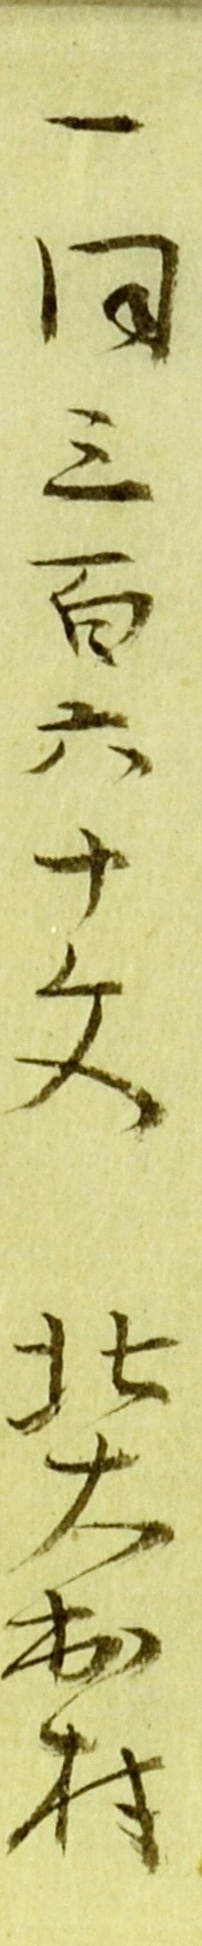一同三百六十文北大出村
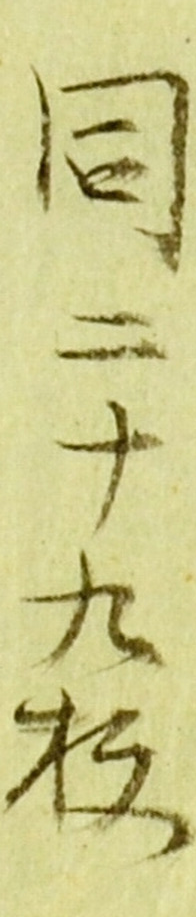同二十九枚
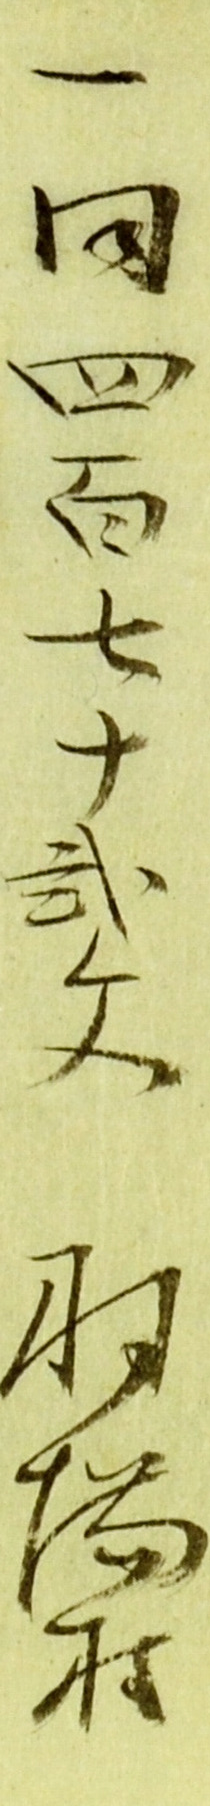一同四百七十弐文羽場村
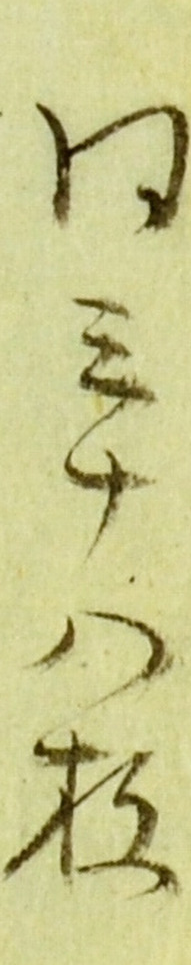同三十八枚
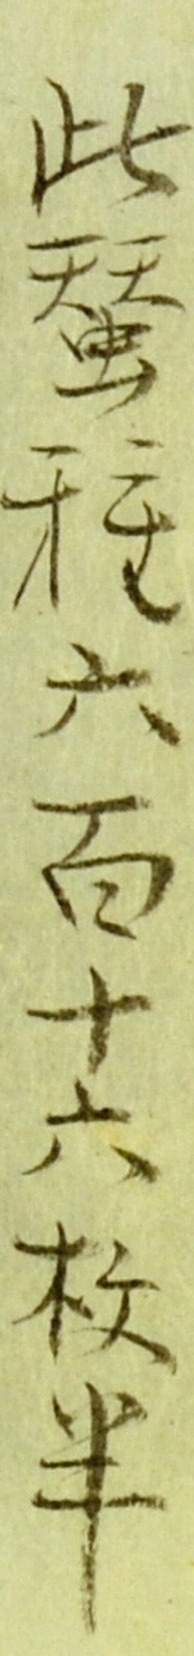此蚕種六百十六枚半

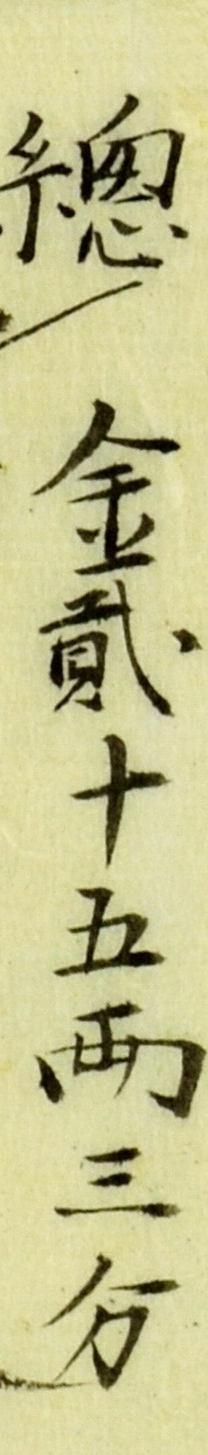総〆金弐十五両三分
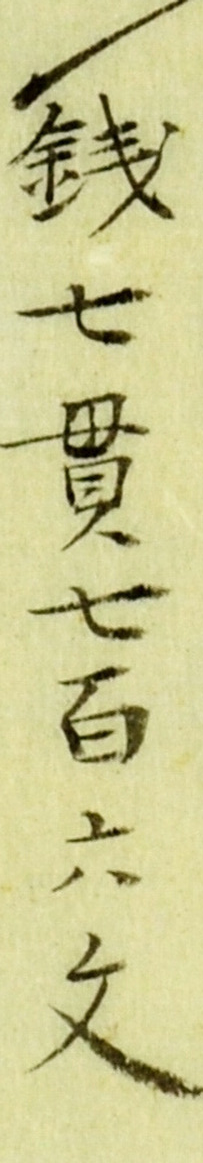銭七貫七百六文

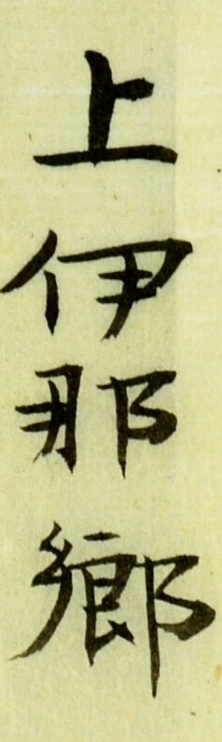上伊那郷
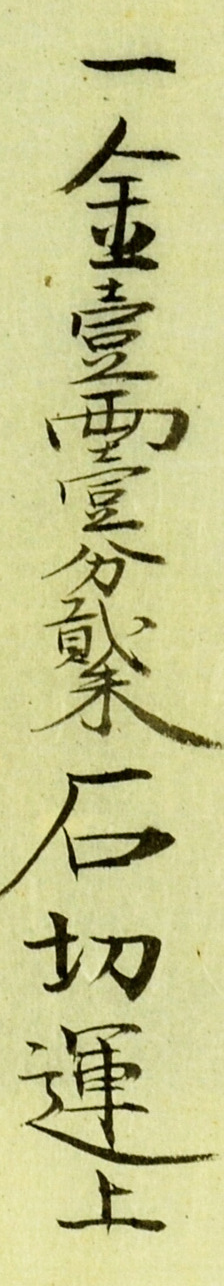一金壱両壱分弐朱石切運上
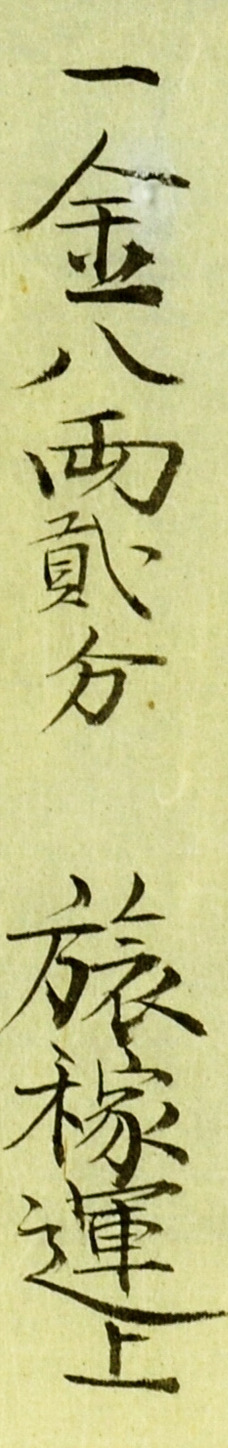一金八両弐分旅稼運上
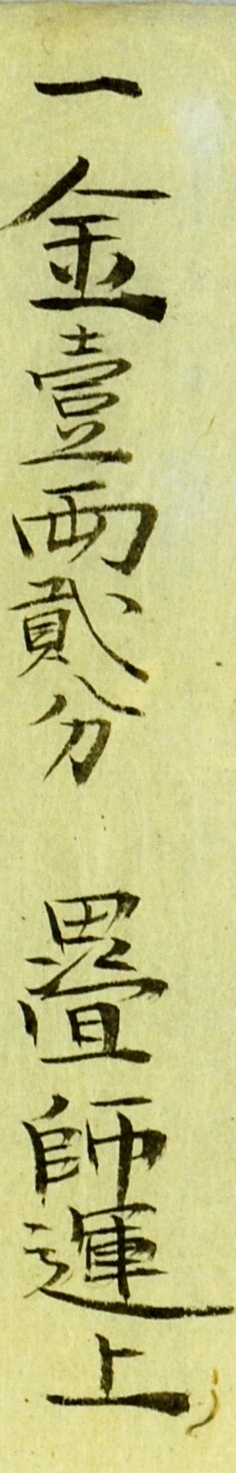一金壱両弐分畳師運上
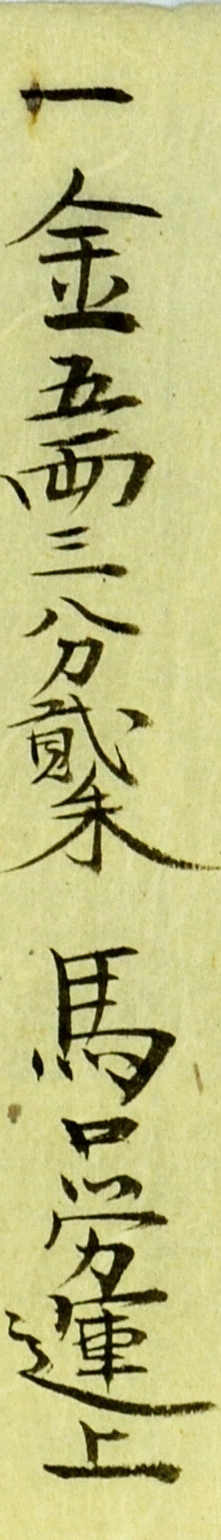一金五両三分弐朱馬口労運上
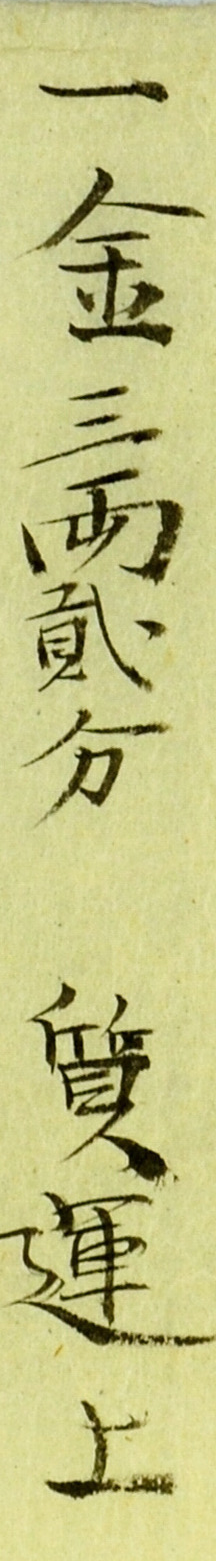一金三両弐分質運上
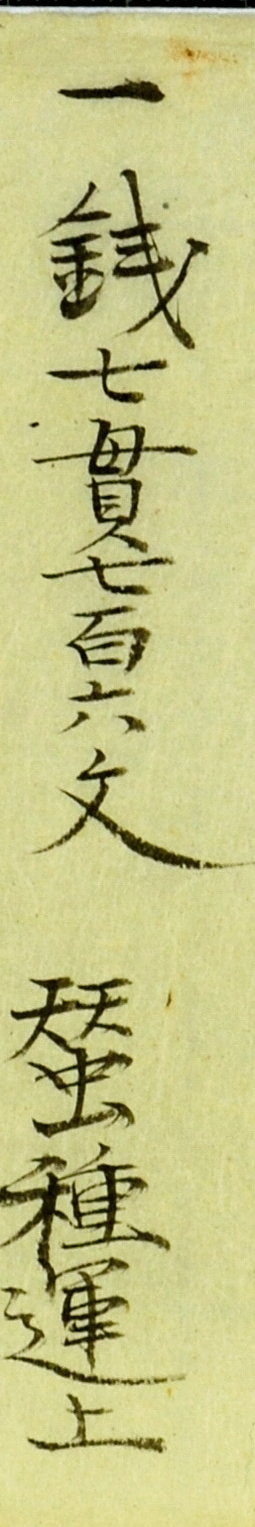一銭七貫七百六文蚕種運上
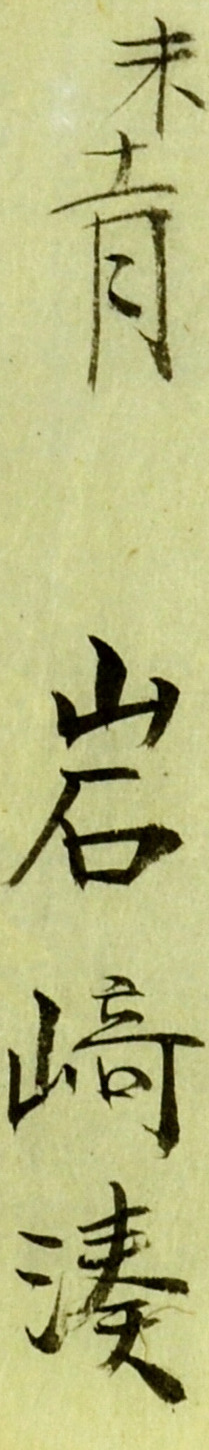未十一月岩崎湊
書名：上伊那郷諸運上取調帳
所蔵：伊那市立高遠町図書館・合同会社AMANE
